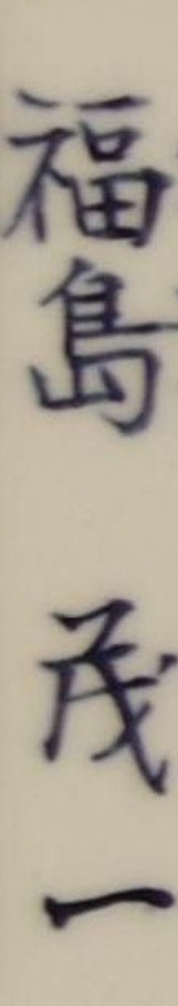福島茂一

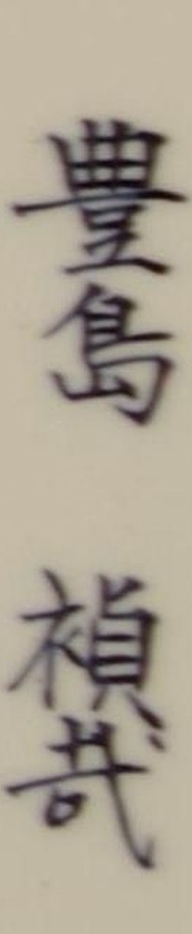豊島禎哉
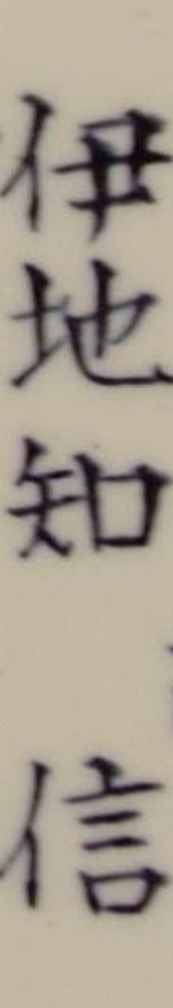伊地知信
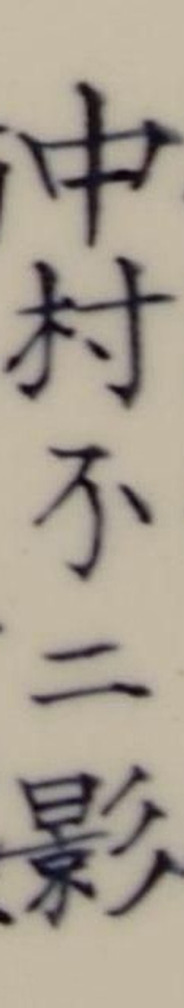中村不二影
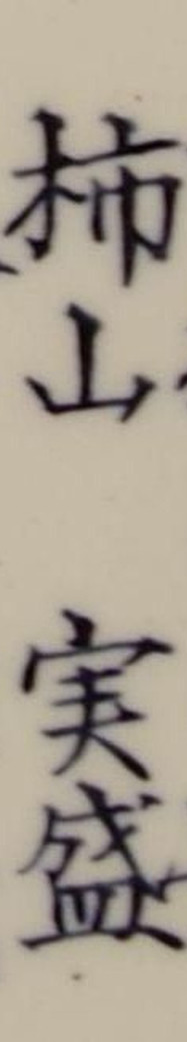柿山実盛
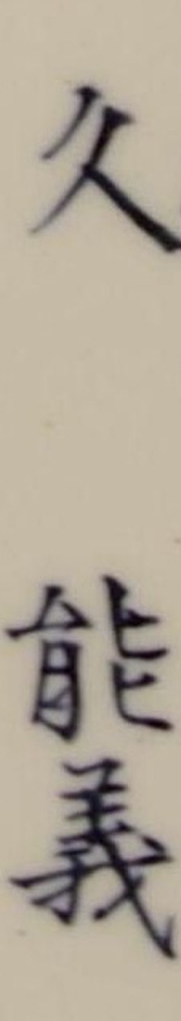久能義
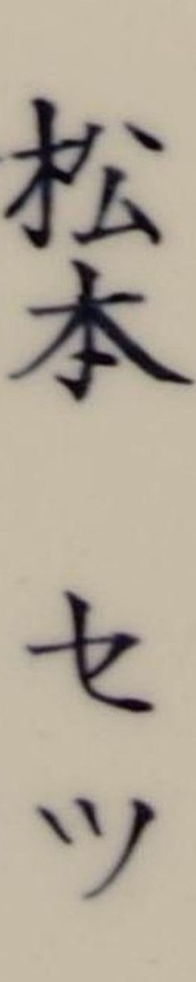松本セツ
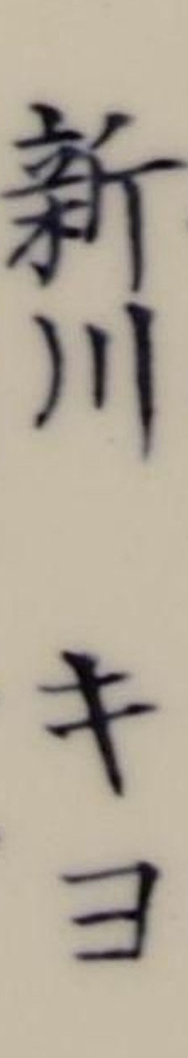新川キヨ
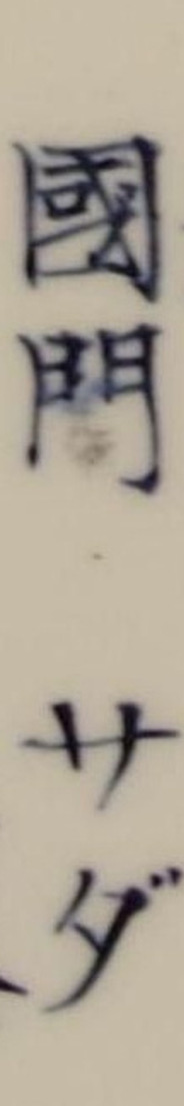國門サダ
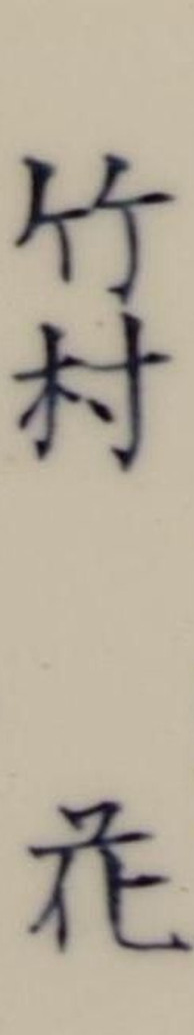竹村花
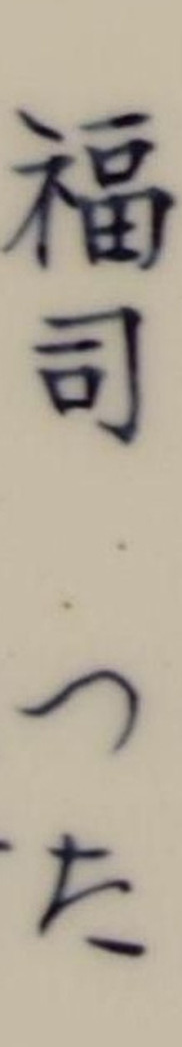福司つた
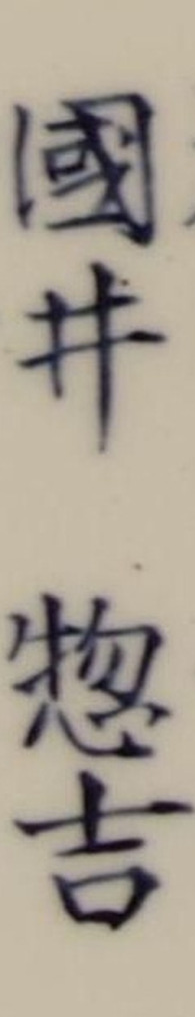浅井惣吉
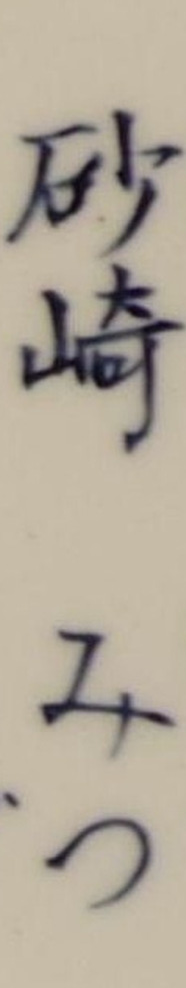砂崎みつ
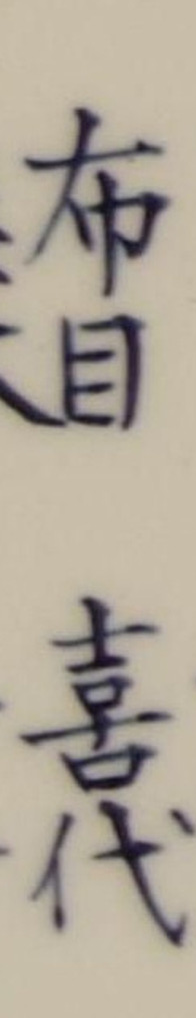布目喜代
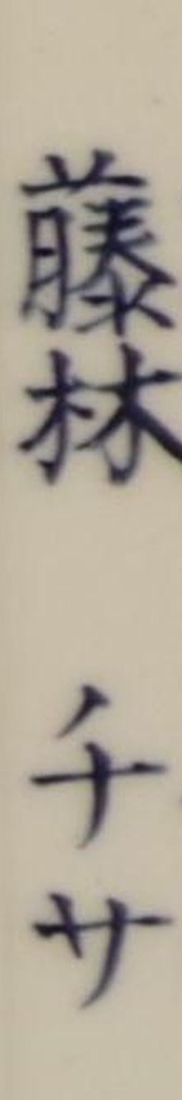藤林チサ

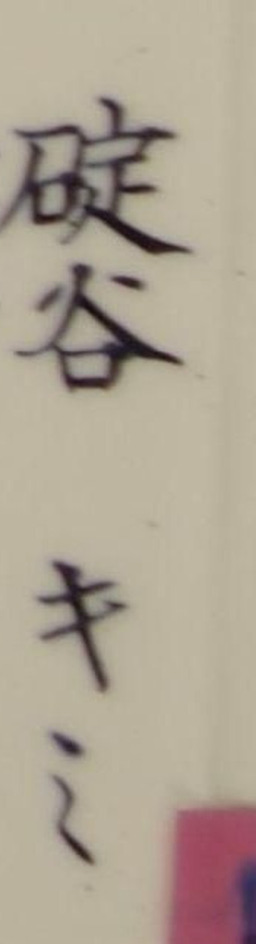碇谷キミ
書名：E~L
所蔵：高野山金剛峯寺
